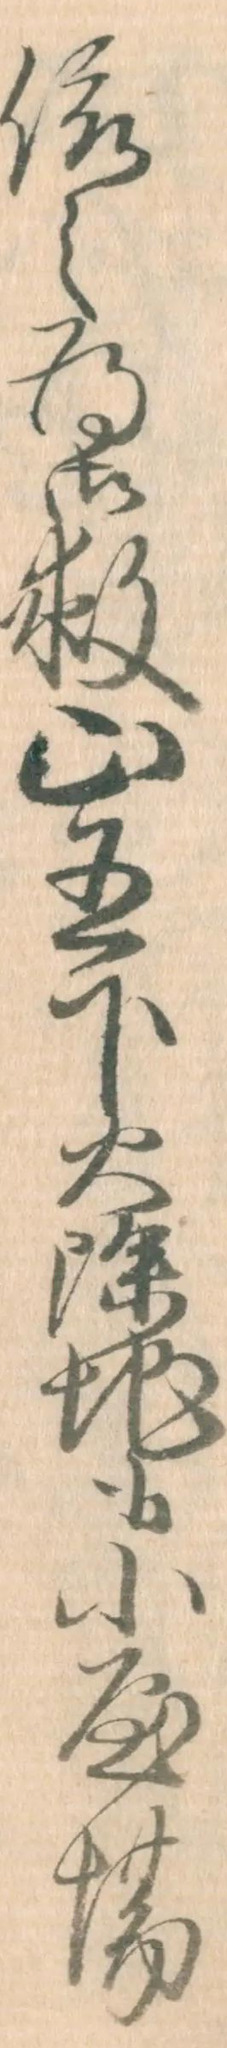依之為御救山王下火除地え小屋場
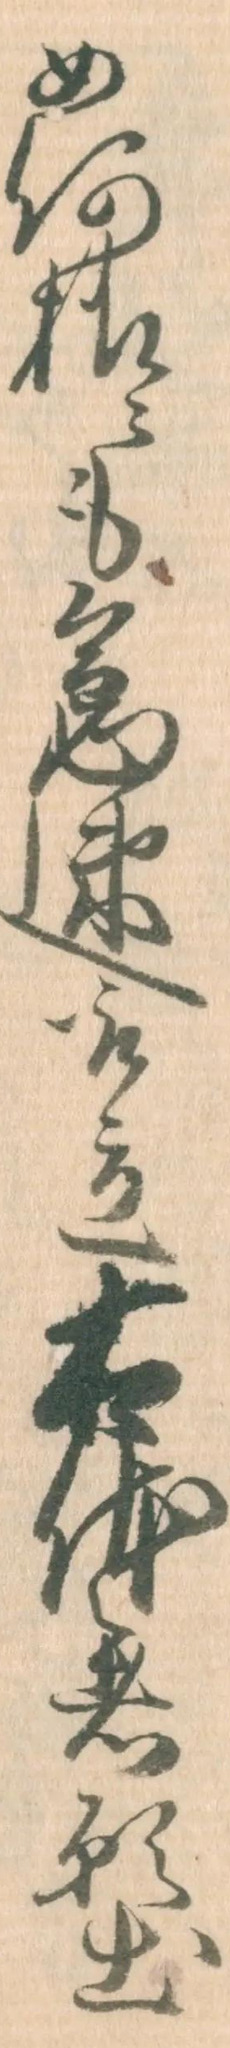如何様ニも急速取立右体之者願出
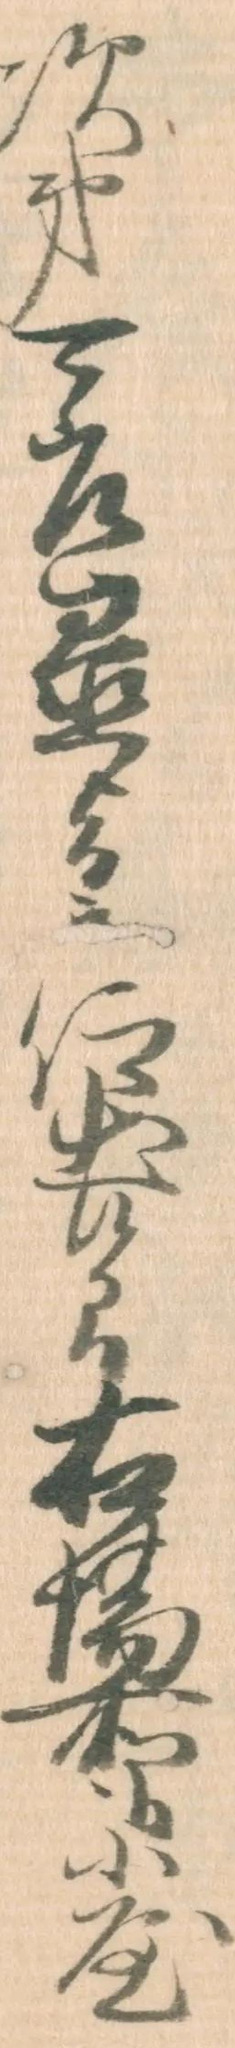次第可差置旨被仰出候間右場所え小屋
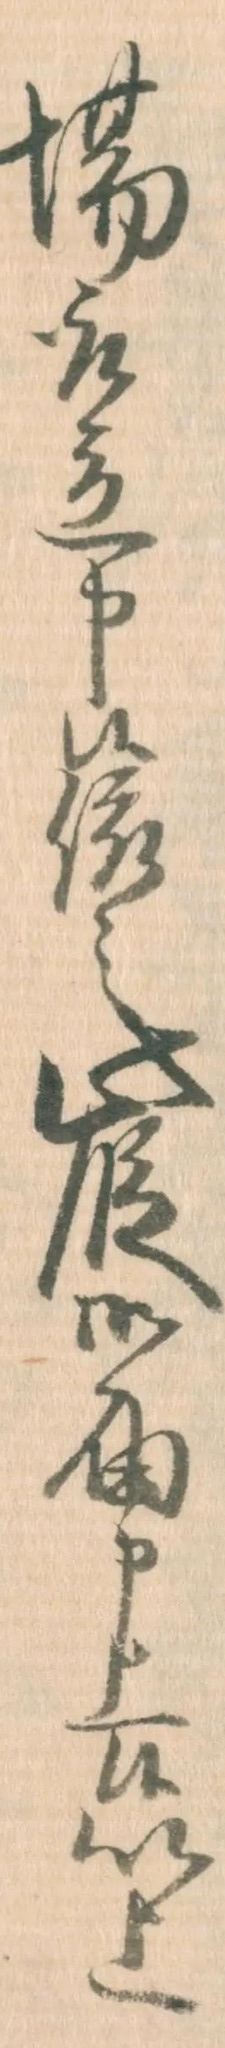場取立申候依之此段御届申上候以上
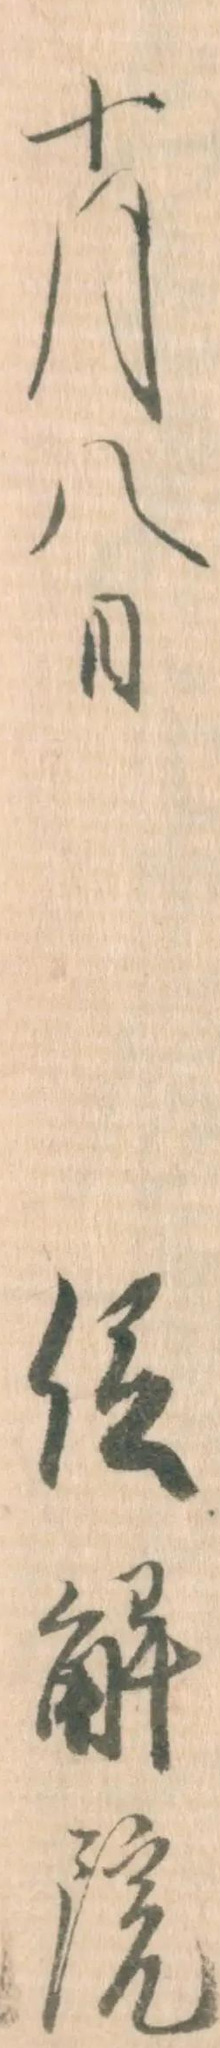十月八日信解院
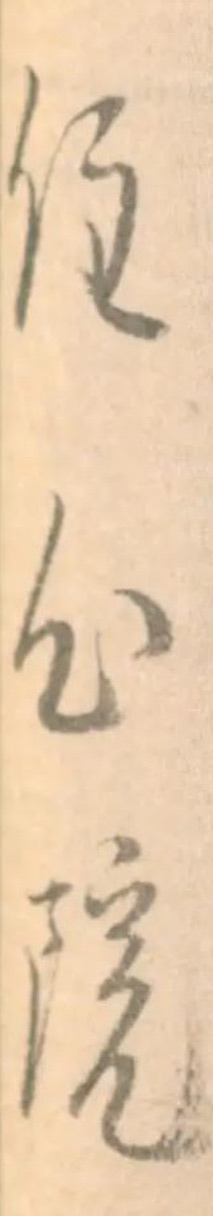住心院
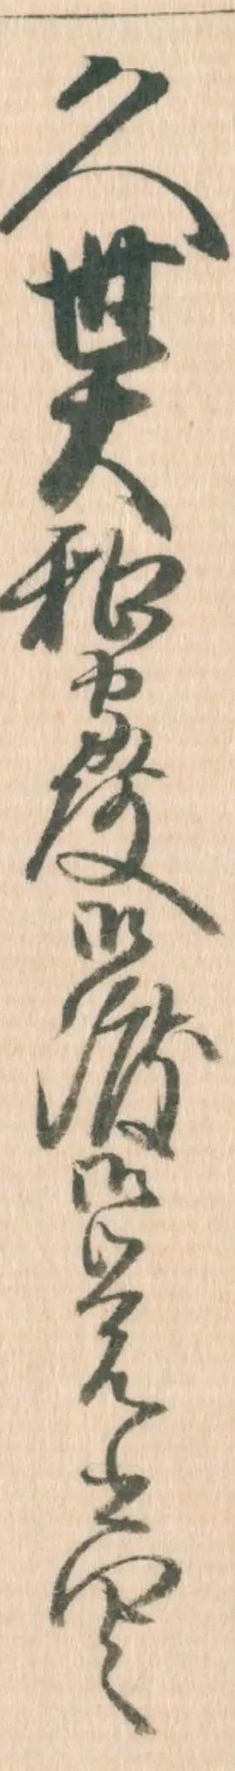│久世大和守殿御渡御覚書写
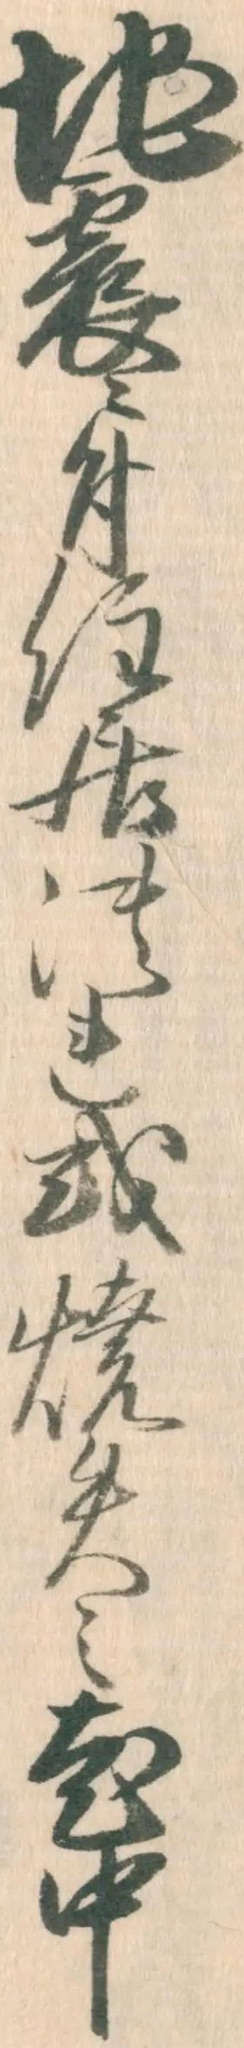地震ニ付住居潰れ或焼失之老中
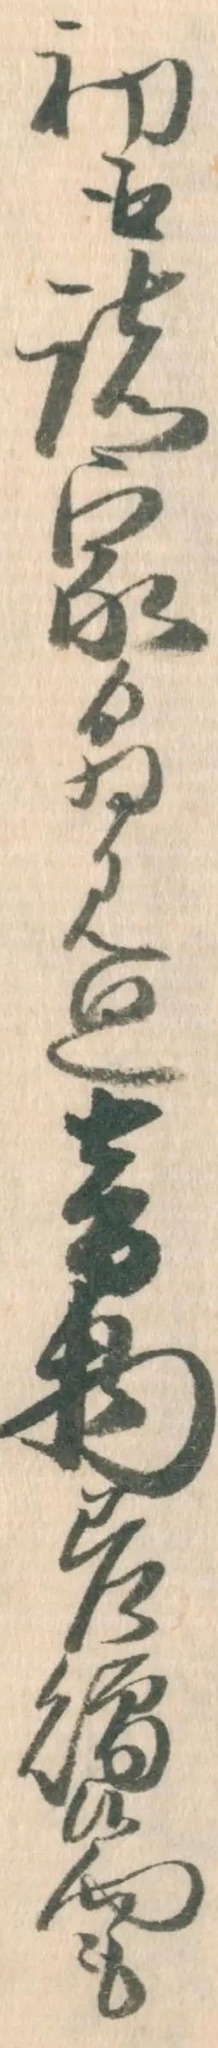初御諸家ゟ為見廻音物差贈候向も
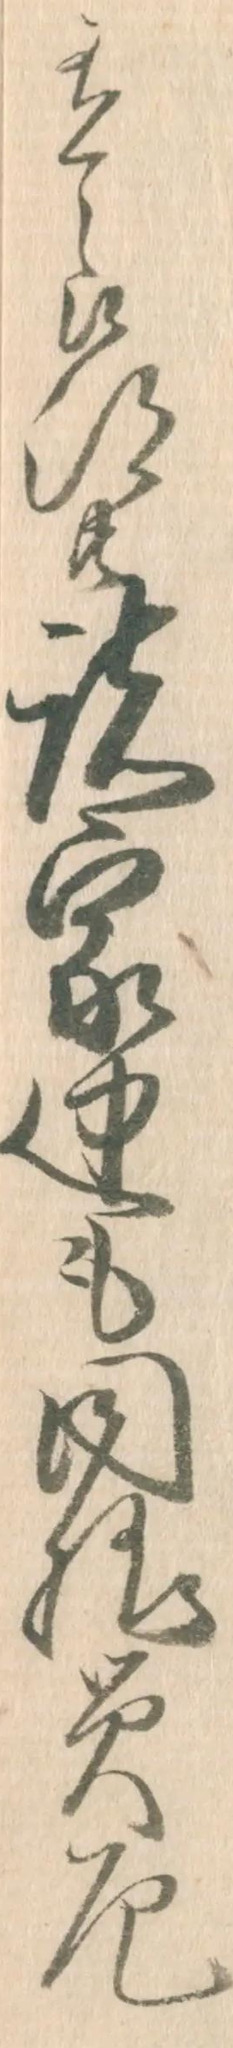有之候得共緒家迚も同様災厄ニ

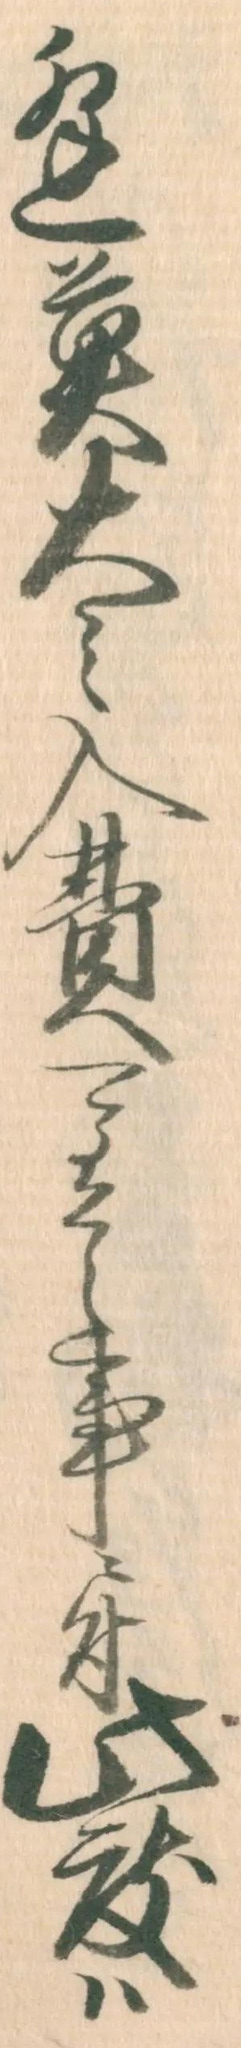逢莫大之入費可有之候事ニ付此度ハ
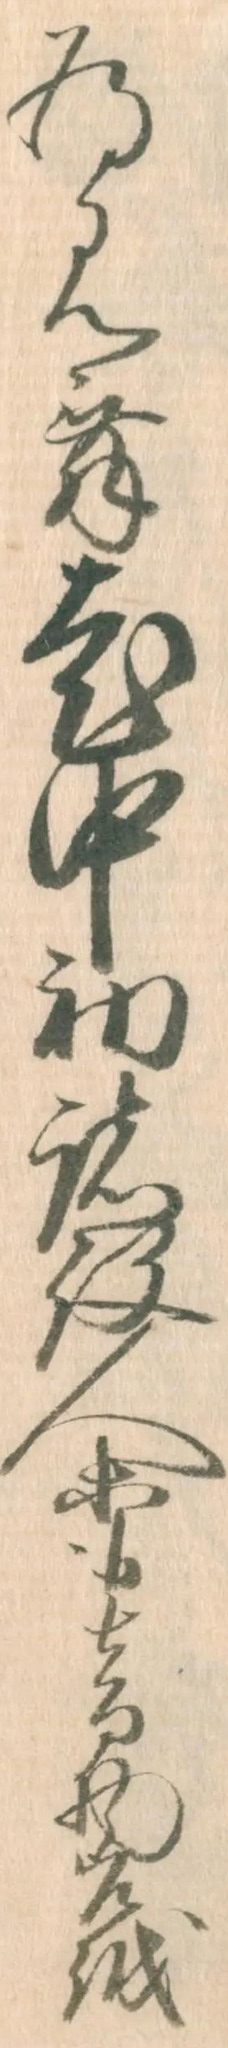為見舞老中初諸役人等え音物差越
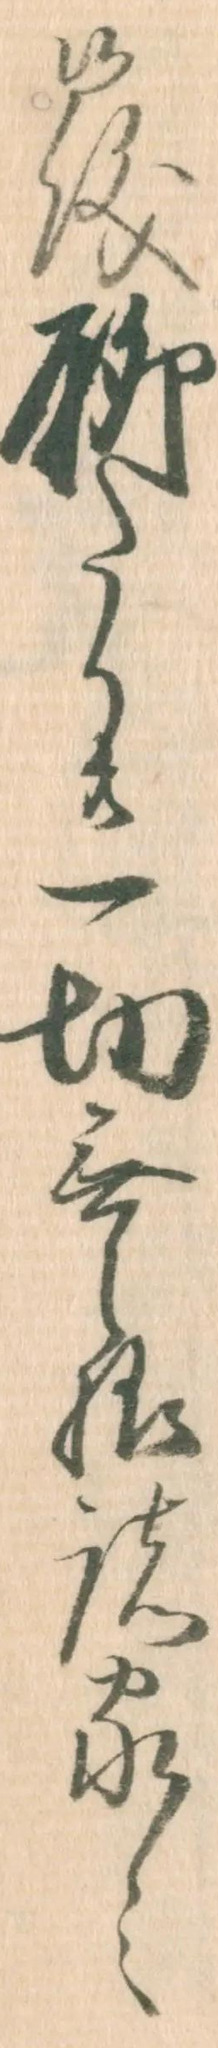候儀聊たり共一切無之様諸家之
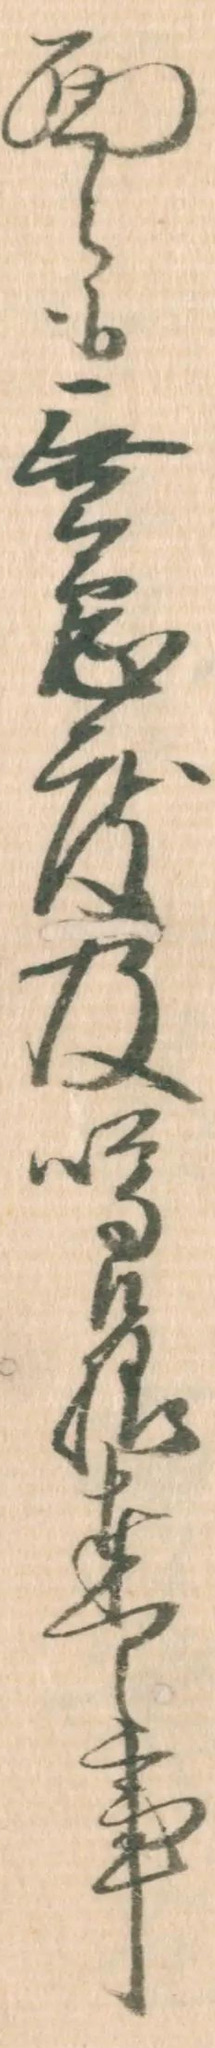面〻も無急度及噯候様達候事
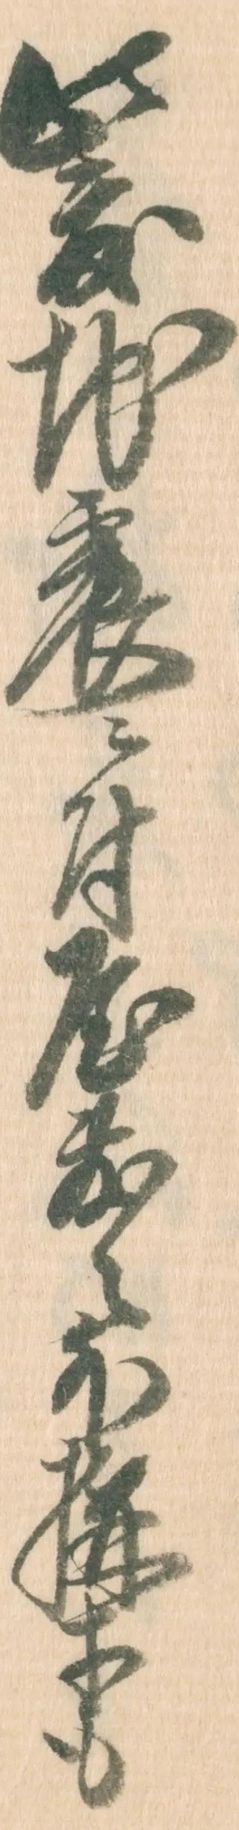此度地震ニ付屋敷之外構等も
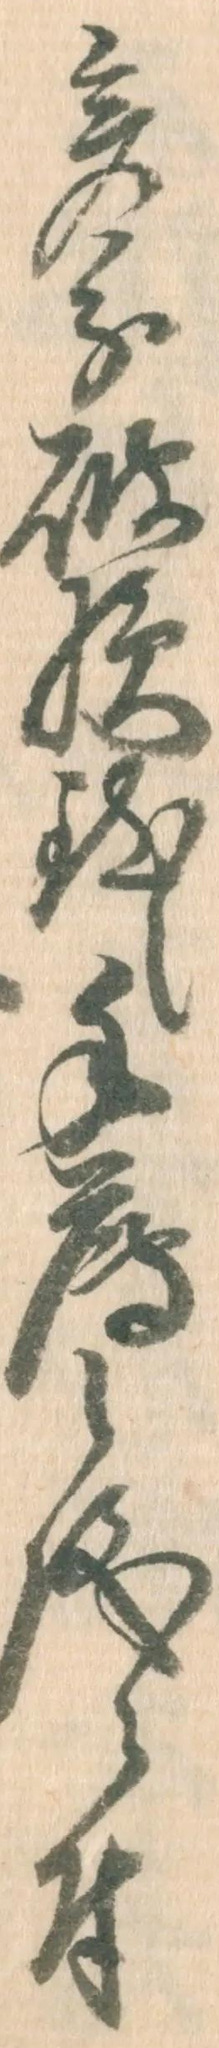多分破損致し手薄之儀ニ付
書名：地震災書留 2巻. [2] 内表紙に「地震一件　安政二卯年十月」とあり
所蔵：国立国会図書館 National Diet Library, JAPAN
